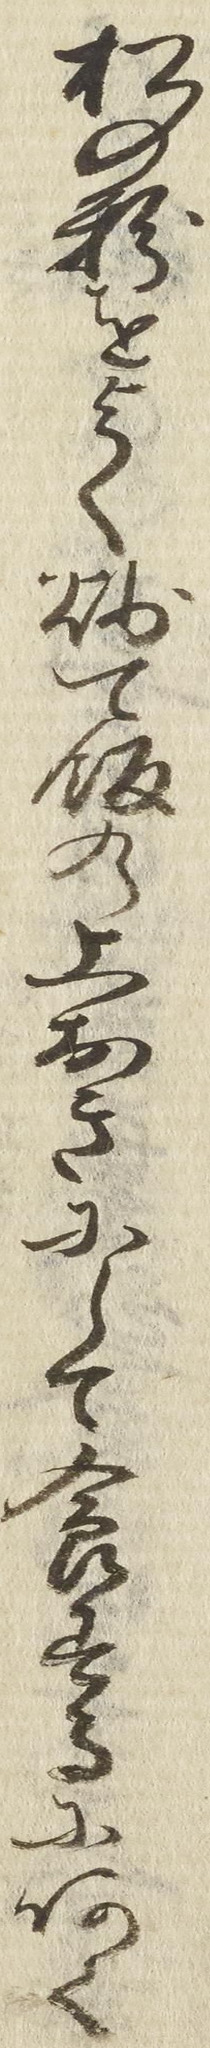松の粉をよく炒て飯の上おきにして食するにあく
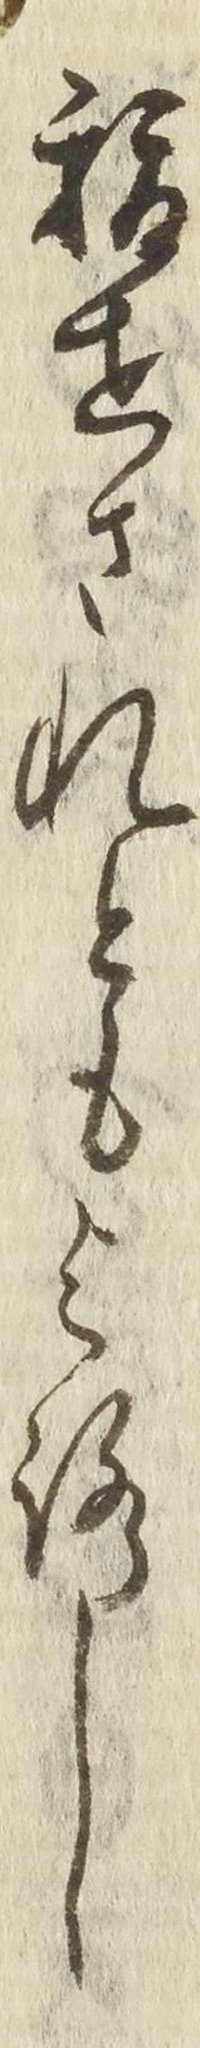抜せされともよろし
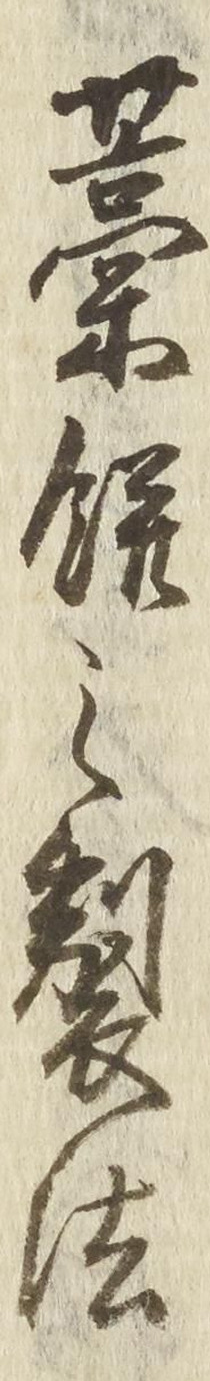藁餅之製法
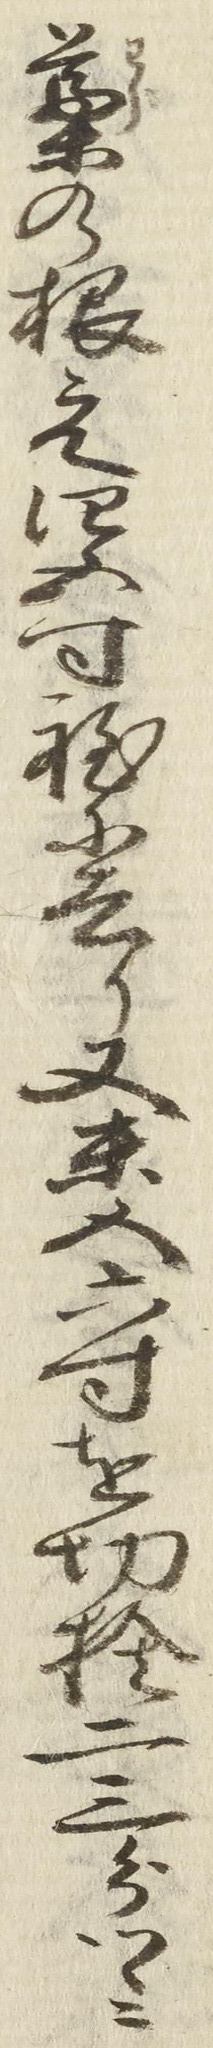藁の根元四五寸程に去り又末五六寸を切捨ニ三分ツヽニ
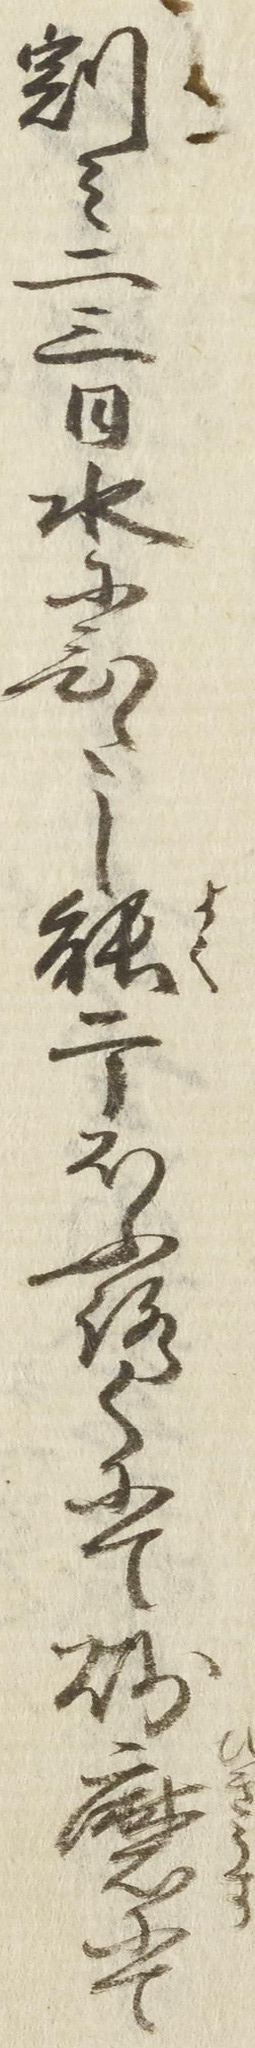刻み二三日水にひたし能干ほふろくにて砂磨にて
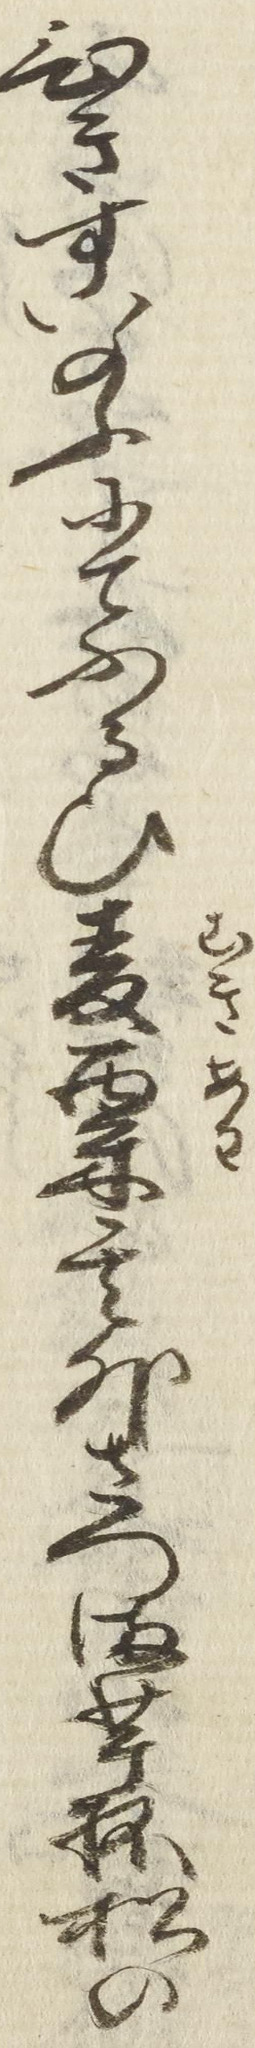ひきすいのふにてふるひ麦粟其外さつま芋抔松の
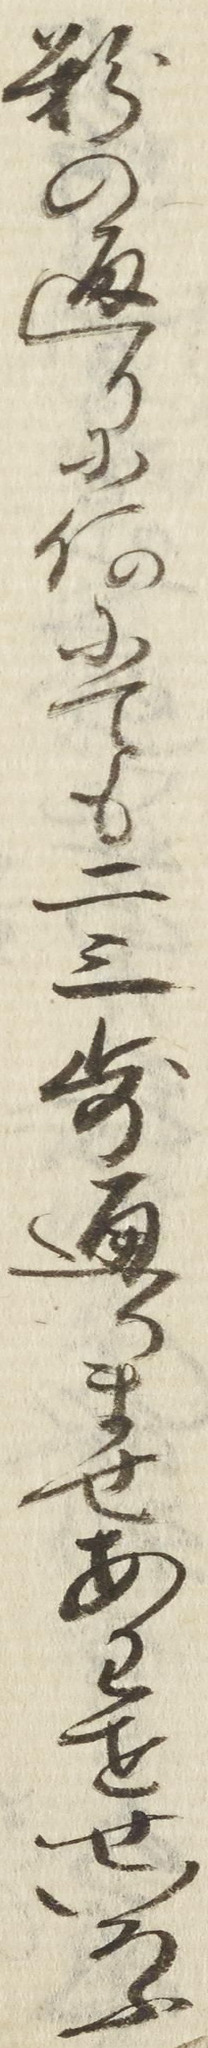粉の通りに何にてもニ三歩通りませあわせせいろふ
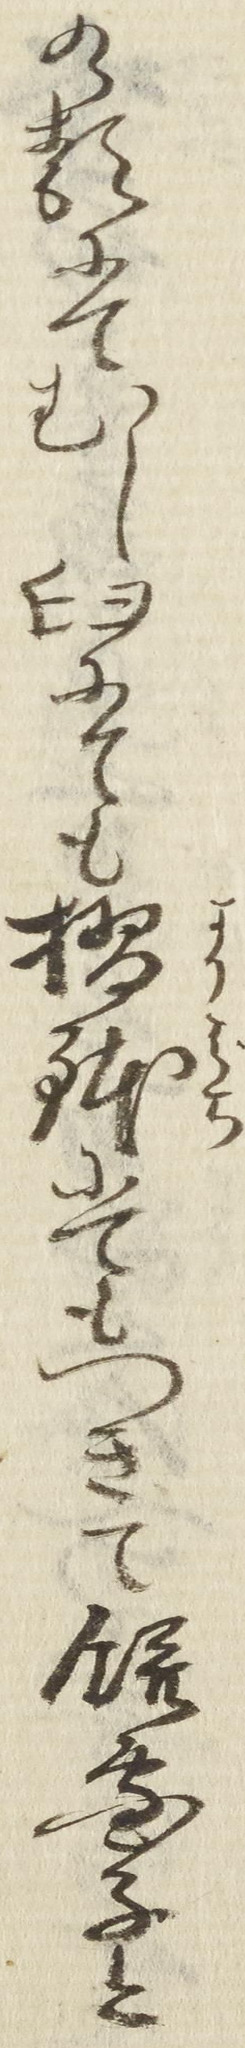の類にてむし臼にても摺鉢にてもつきて餅団子と
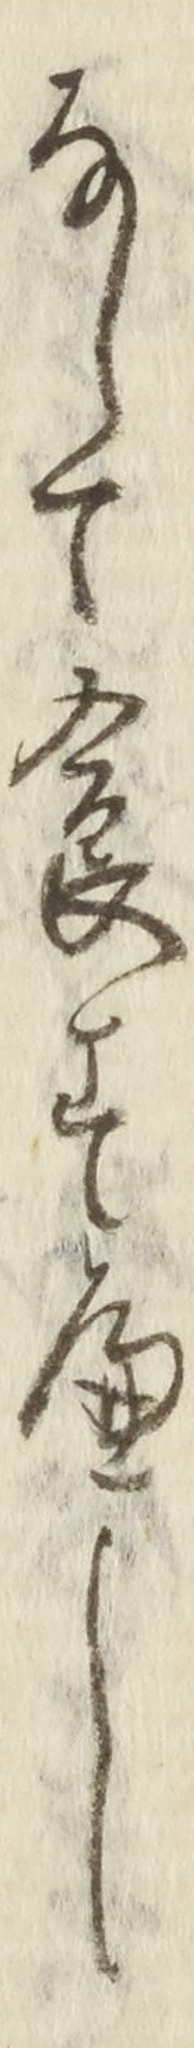なして食すへし
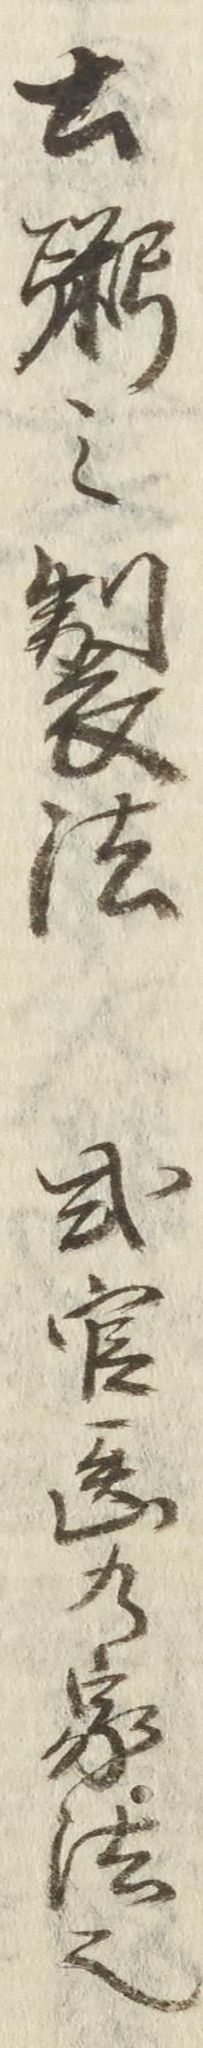土粥之製法或官医の家法也
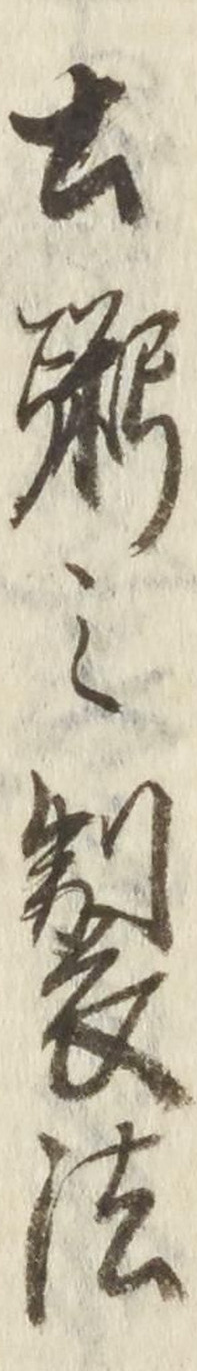藁餅之製法
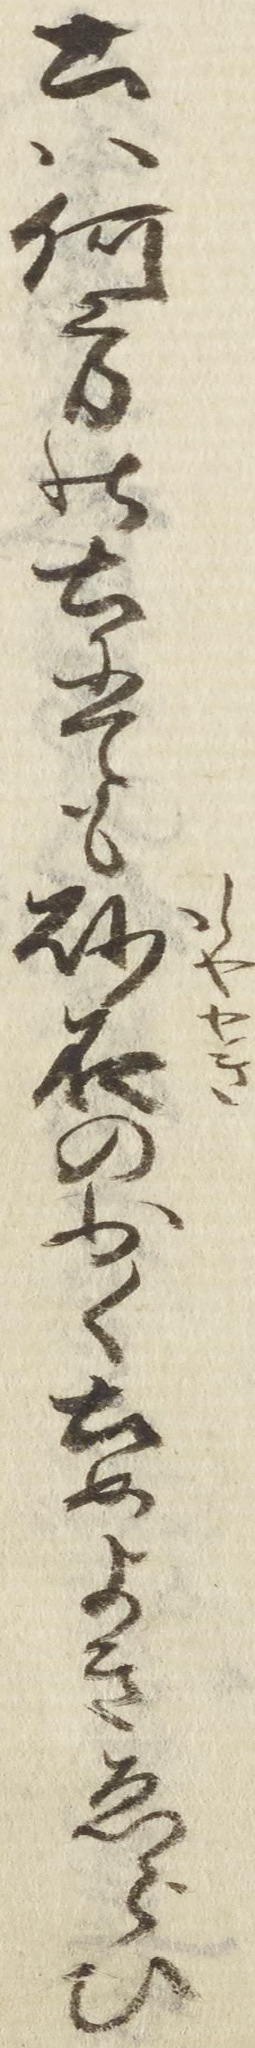土は何方の土にても砂石の少く土めよきゑらひ

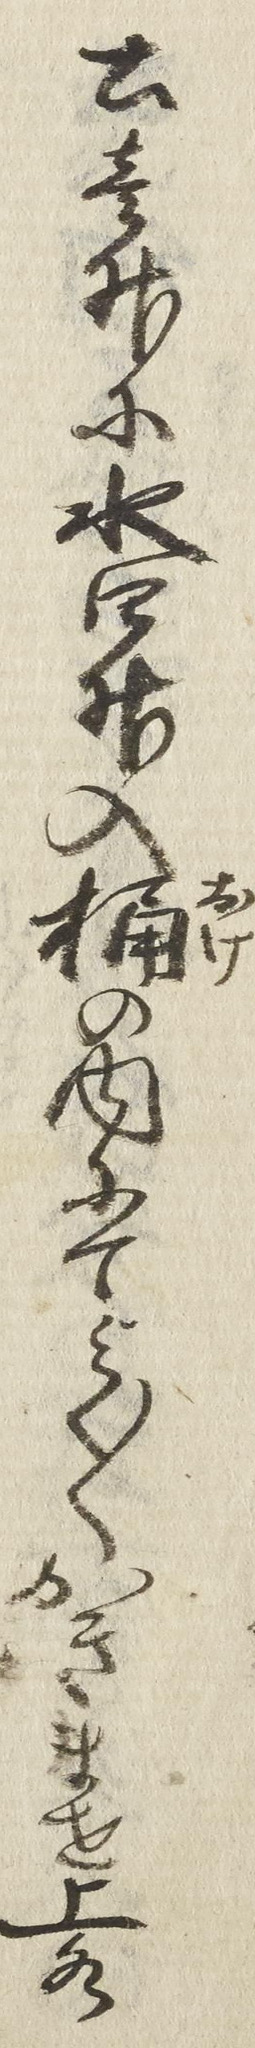土壱升に水四升入桶の内にてよく〳〵かきませ上水
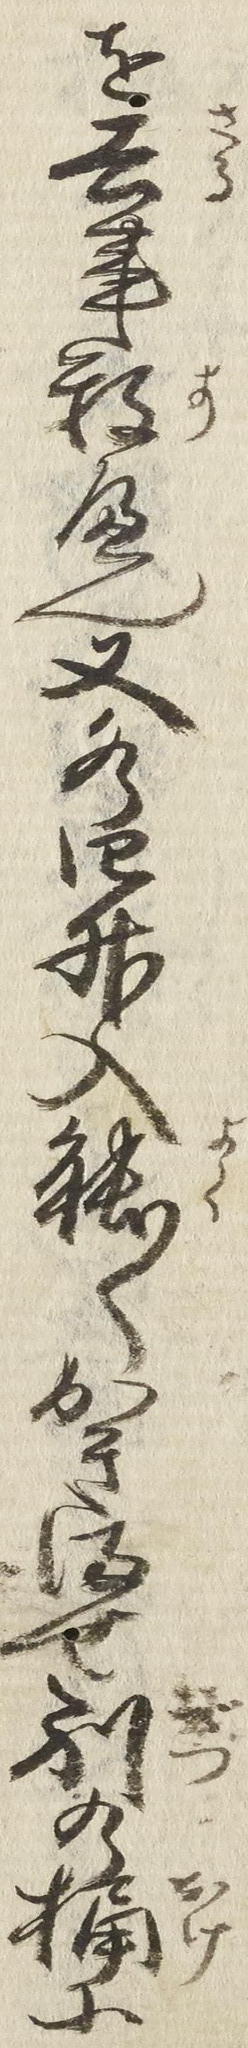を去事数へん又水四升入能くかきませ別の桶に
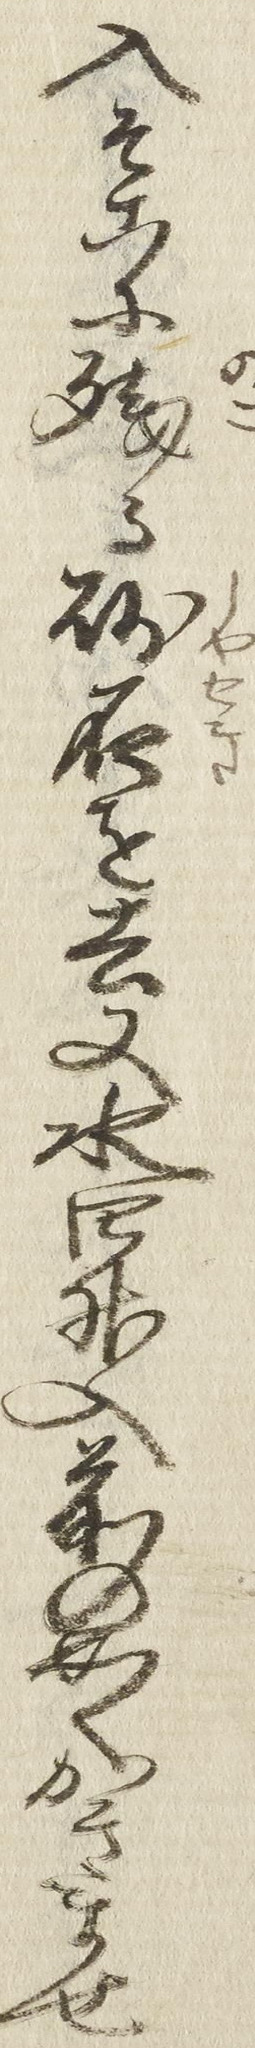入そこに残る砂石を去又水四升前の如くかきませ
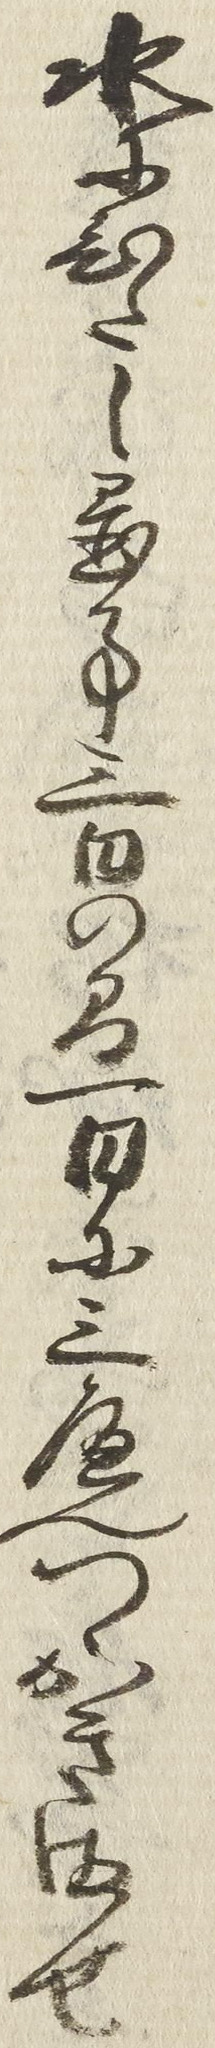水にひたし置事三日の間一日に三へんつゝかきませ
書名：天明奇畧　全
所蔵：東京大学地震研究所図書室 Earthquake Research Institute Library, The University of Tokyo, JAPAN
